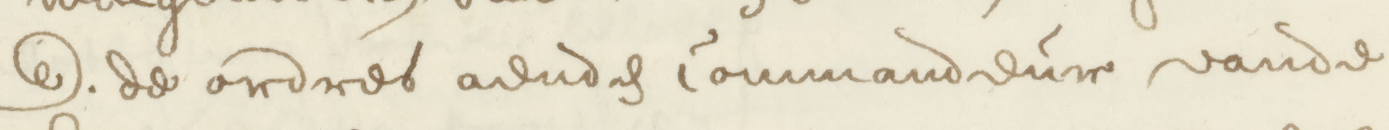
E. de ordres aenden Commandeur vande
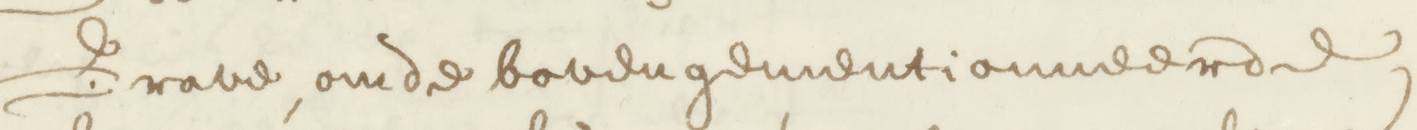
Grave, om de bovengementionneerde
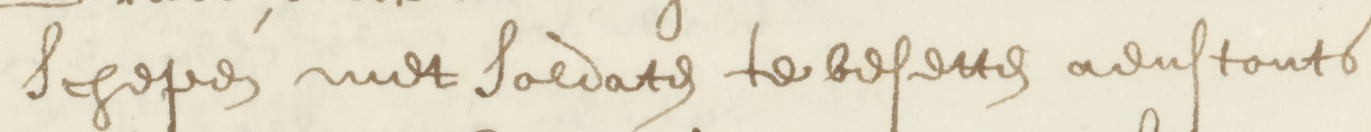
Schepen met Soldaten te besetten aenstonts
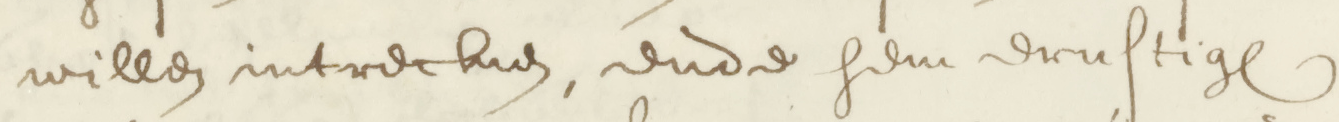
willen intrecken, ende hem ernstigh
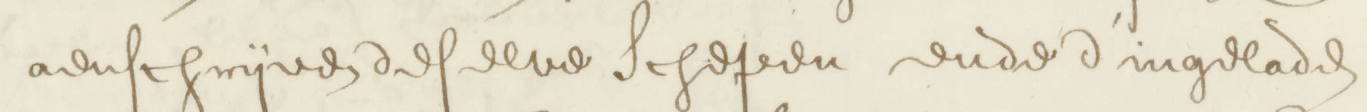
aenschrijven deselve Schepen ende d'ingeladen
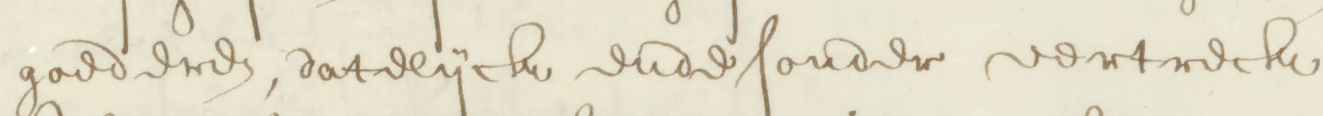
goederen, datelijck ende sonder vertreck
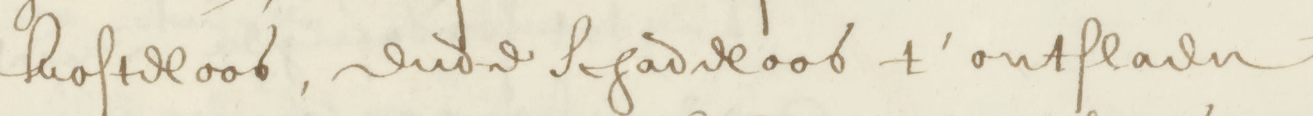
kosteloos, ende schadeloos t'ontslaen
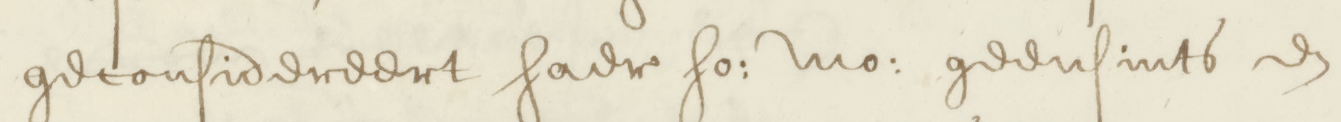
geconsidereert haer Ho:Mo: geensints en
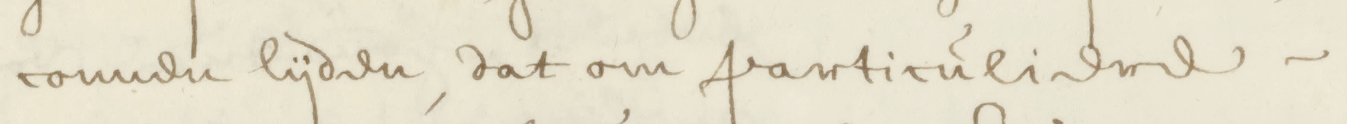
connen lijden, dat om particuliere
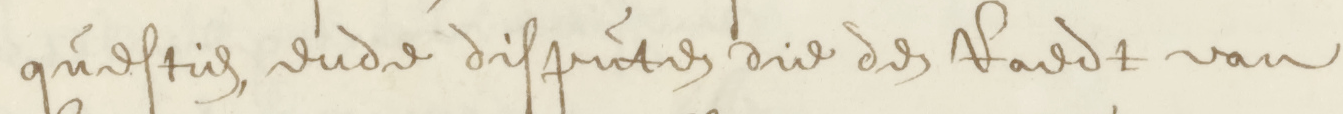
questien, ende disputen die den Raedt van
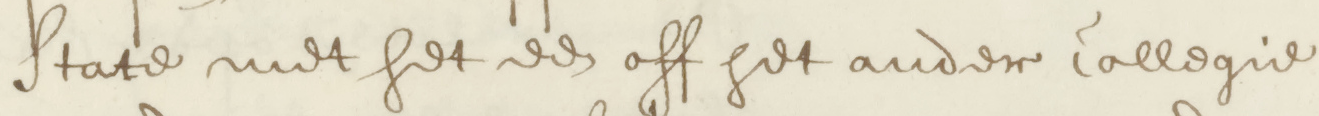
State met het een off het ander Collegie
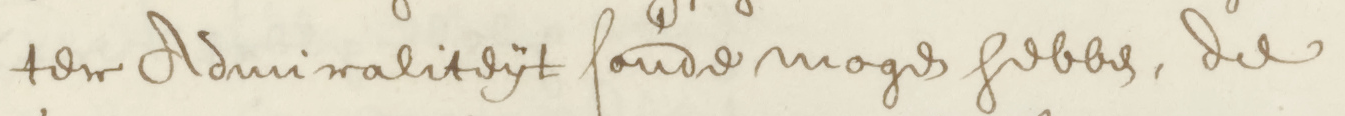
ter Admiraliteijt soude mogen hebben, de
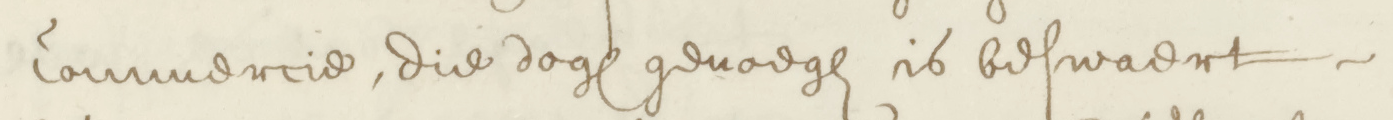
Commercie, die dogh genoegh is beswaert
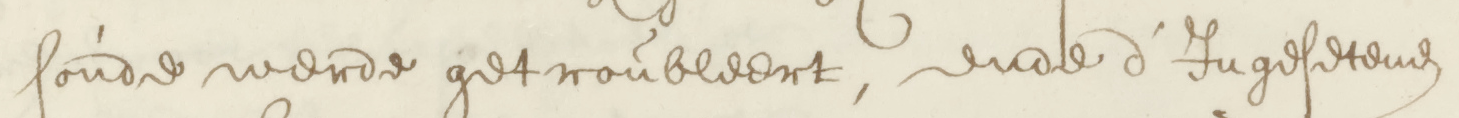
soude werde getroubleert ende d'Ingesetenen
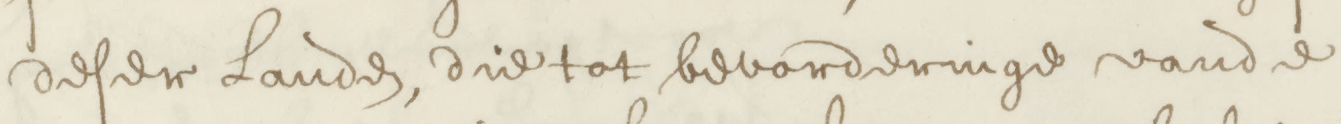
deser Landen, die tot bevorderinge vande
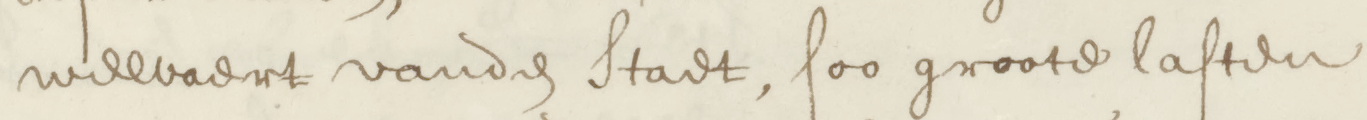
welvaert vanden Staet, soo groote lasten
